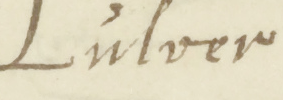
Pulver
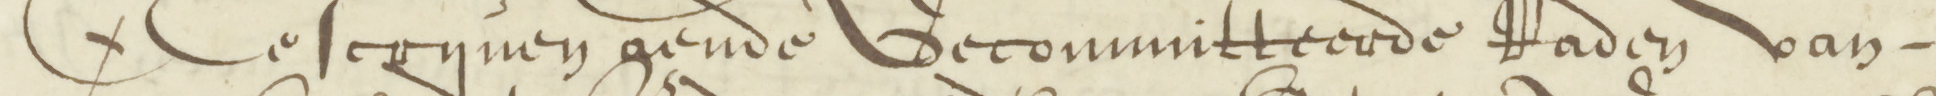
Te scryuen aende Gecommitteerde Raden van
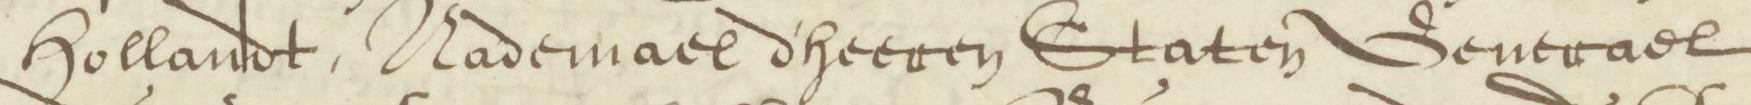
Hollandt, Nademael d'heeren Staten Generael
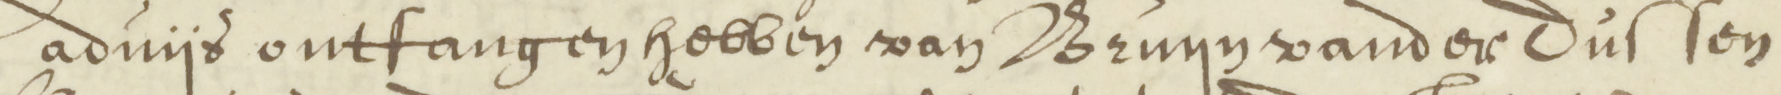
aduijs ontfangen hebben van Bruyn vander Dussen
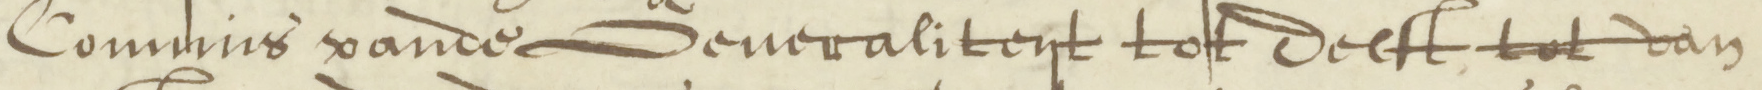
Commis vande Generaliteyt tot Delft tot van
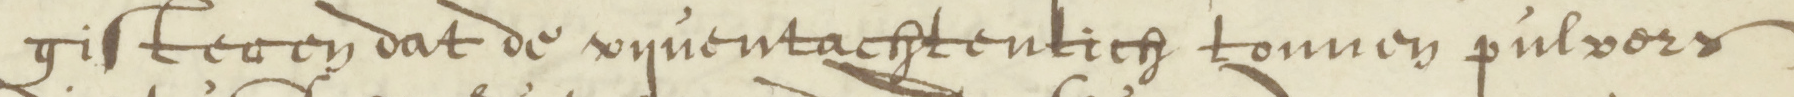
gisteren dat de vyuentachtentich tonnen pulvers
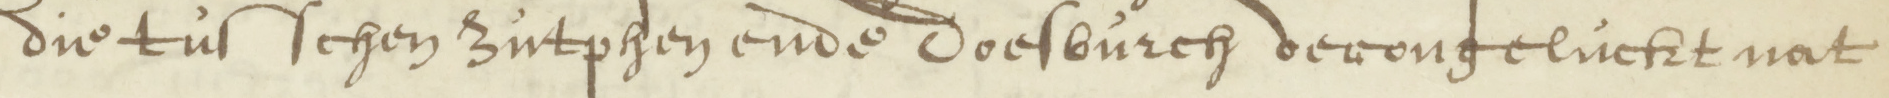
die tusschen Zutphen ende Doesburch verongeluckt nat
